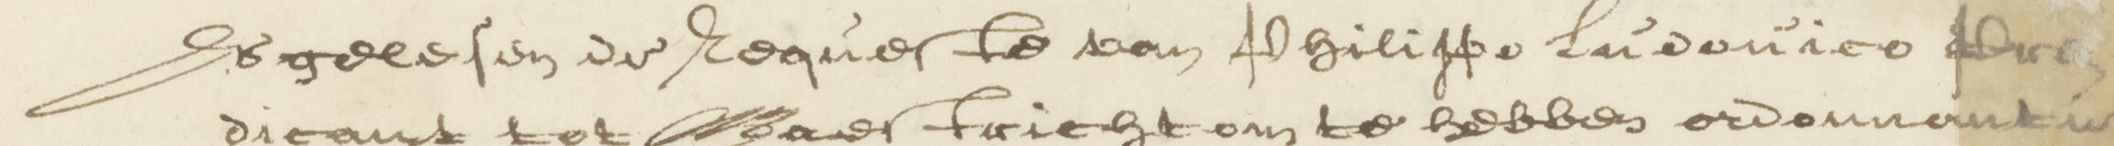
Is gelesen de requeste van Philippo Ludouico Pre,,
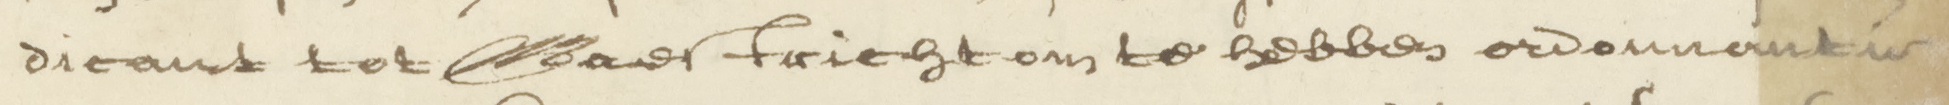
dicant tot Maestricht om te hebben ordonnantie
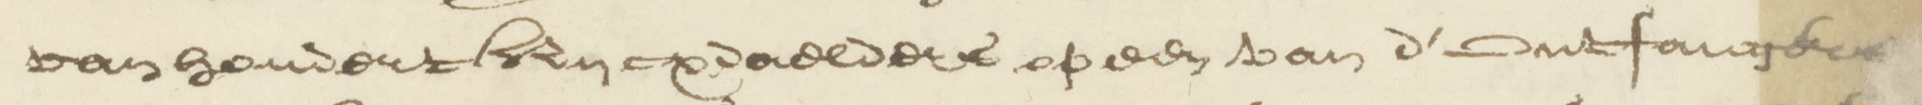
van hondert Rycxdaelders op een van d'Ontfangers
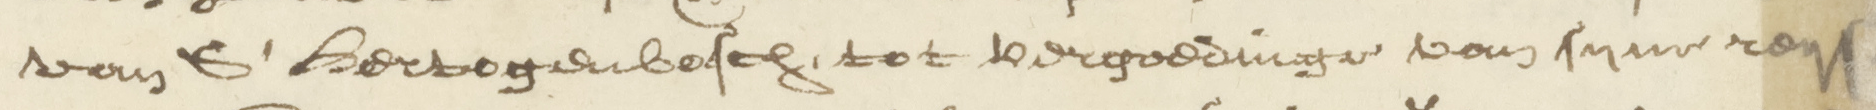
van S'Hertogenbosch, tot vergoedinge van syne reys„
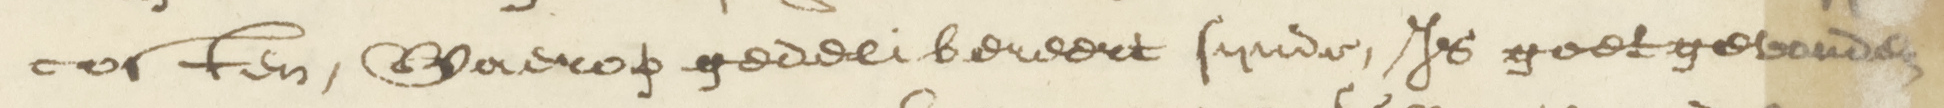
costen. Waerop gedelibereert synde, Is goetgevonden
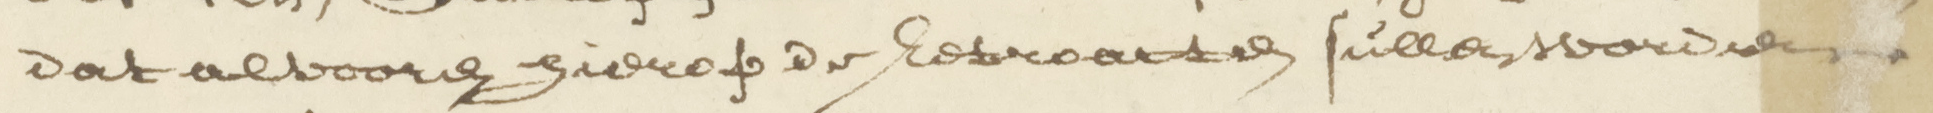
dat alvooren hierop de retroacten sullen worden
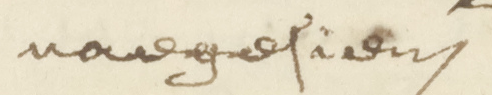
naegesien.
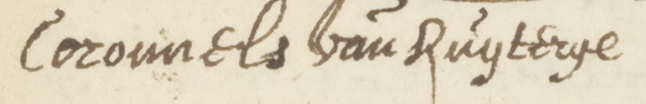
Coronnels van Ruyterye
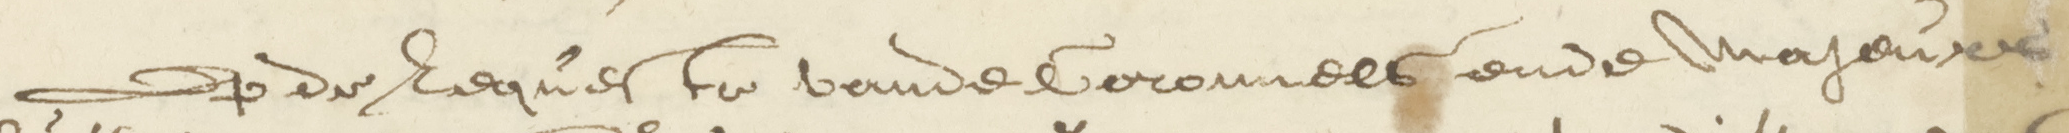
Opde requeste vande Coronnels ende Majeurs
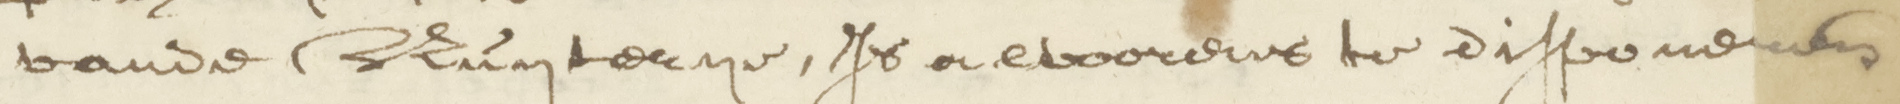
vande Ruyterye, Is alvoorens te disponeneren
